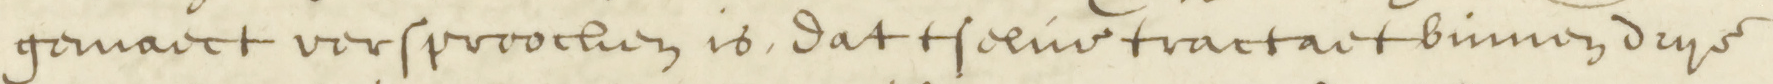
gemaect versproocken is, dat tselue tractaet binnen drye
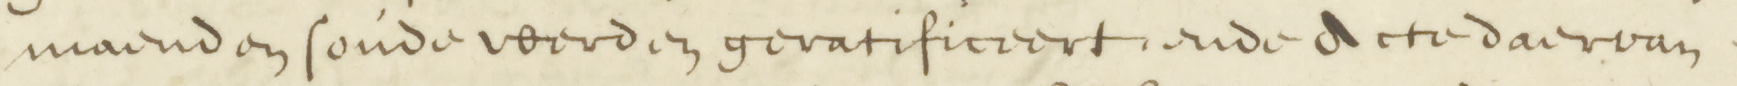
maenden soude werden geratificeert, ende Acte daervan
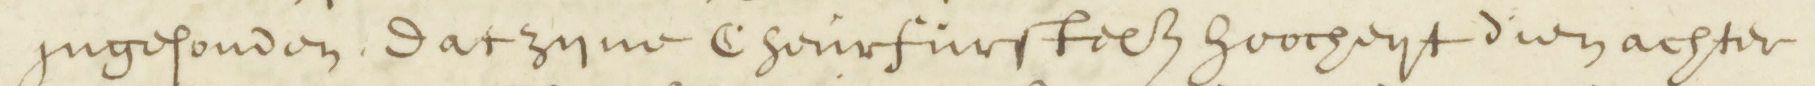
ingesonden. Dat zyne Cheurfurstel hoocheyt dien achter„
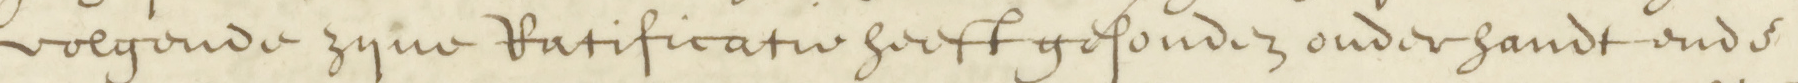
volgende zyne Ratificatie heeft gesonden onder handt ende
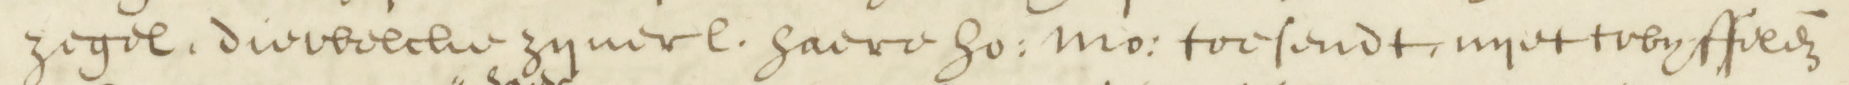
zegel, diewelcke zyner L. haere Ho:Mo: toesendt, nyet twyfelen
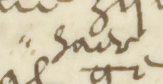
,, haer
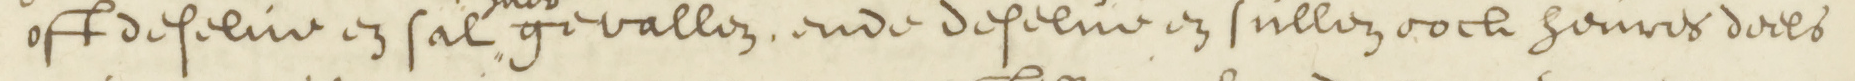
off deselue en sal,,gevallen, ende deselue en sullen oock heures deels
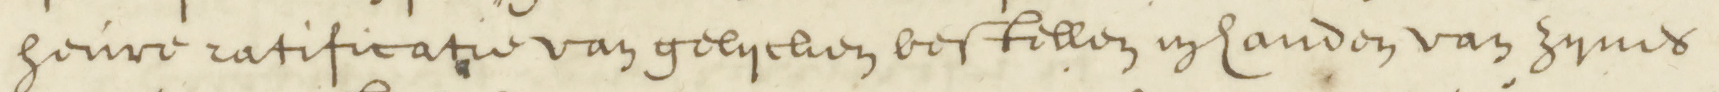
heure ratificatie van gelycken bestellen in handen van zynes
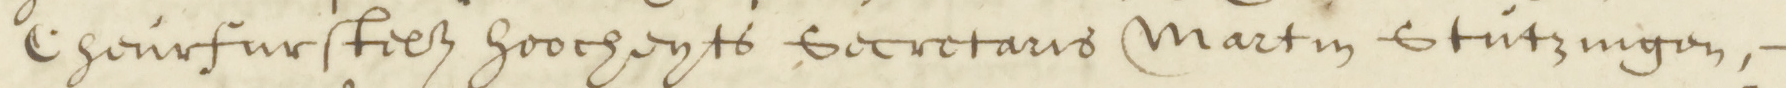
cheurfurstel hoocheyts secretaris Martin Stutzingen
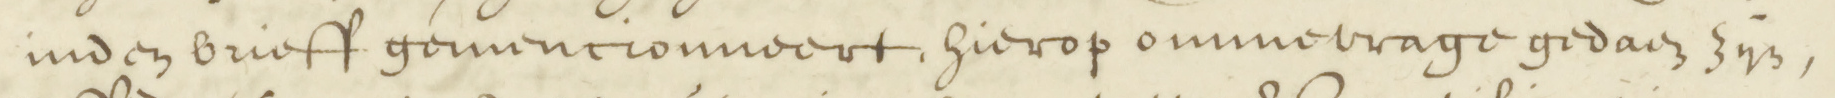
inden brieff gemencionneert, hierop ommevrage gedaen zijn,
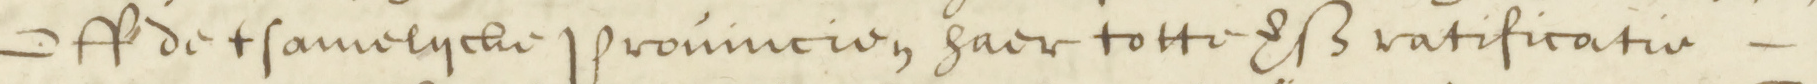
Off de tsamelycke provincien haer totte vs ratificatie -
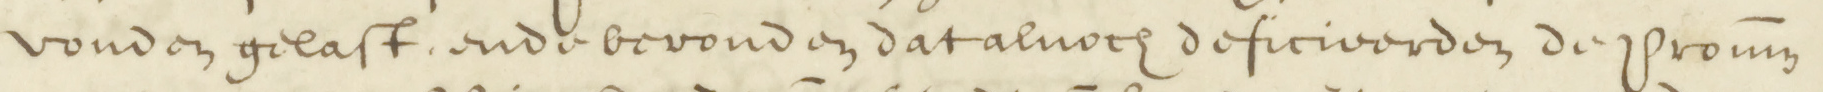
vonden gelast ende bevonden dat alnoch deficieerden de prouin
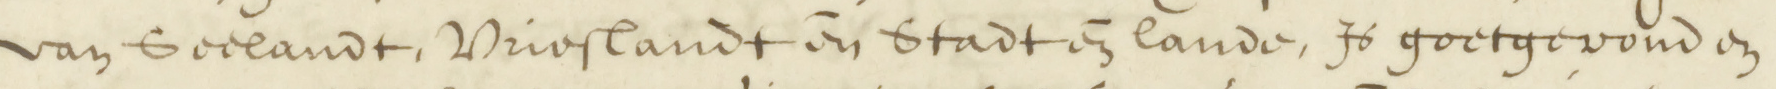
van Seelandt, Vrieslandt en Stadt en lande. Is goetgevonden
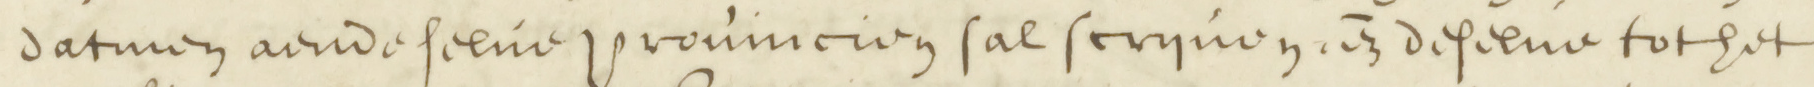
datmen aende selue provincien sal scryven en deselue tot het
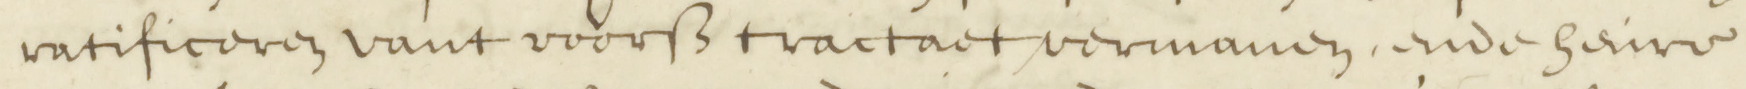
ratificeren vant voors tractaet vermanen ende heure
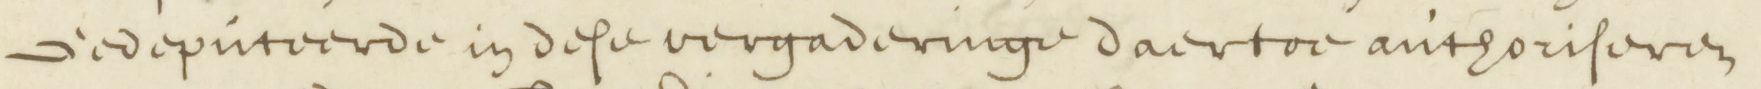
Gedeputeerde in dese vergaderinge daertoe authoriseren
